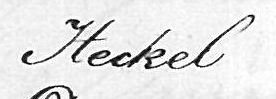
Heckel
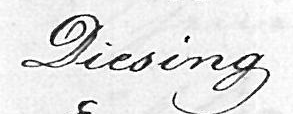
Diesing
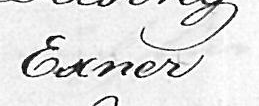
Exner
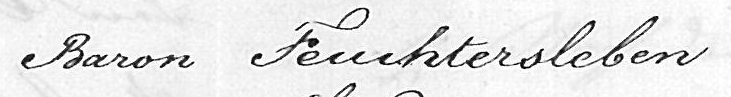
Baron Feuchtersleben
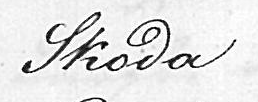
Skoda
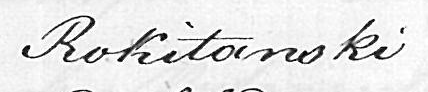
Rokitanski
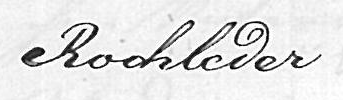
Rochleder
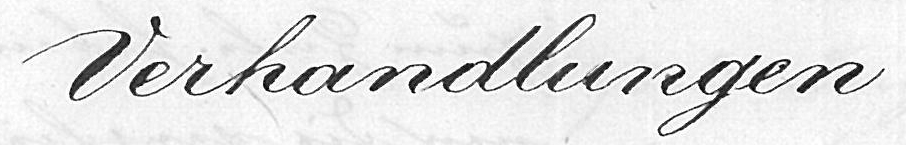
Verhandlungen
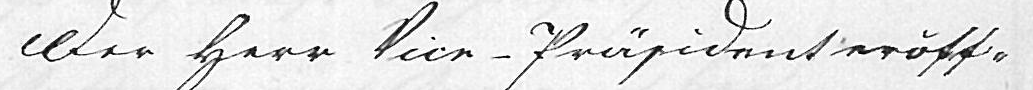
Der Herr Vice-Präsident eröff-
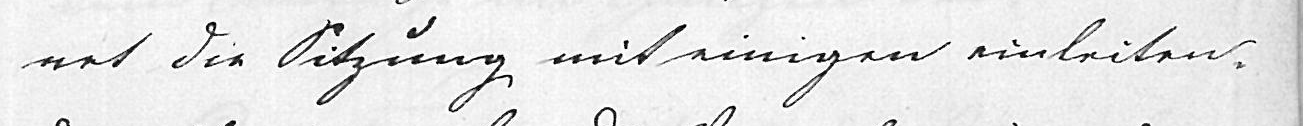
net die Sitzung mit einzigen einleiten-
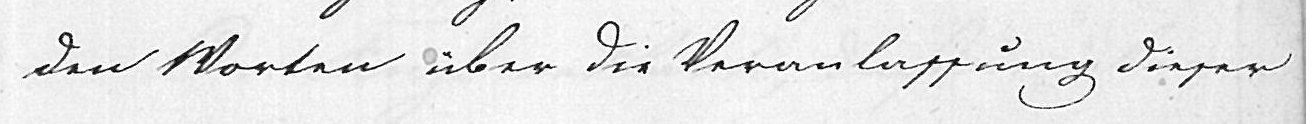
den Worte über die Veranlassung dieser
